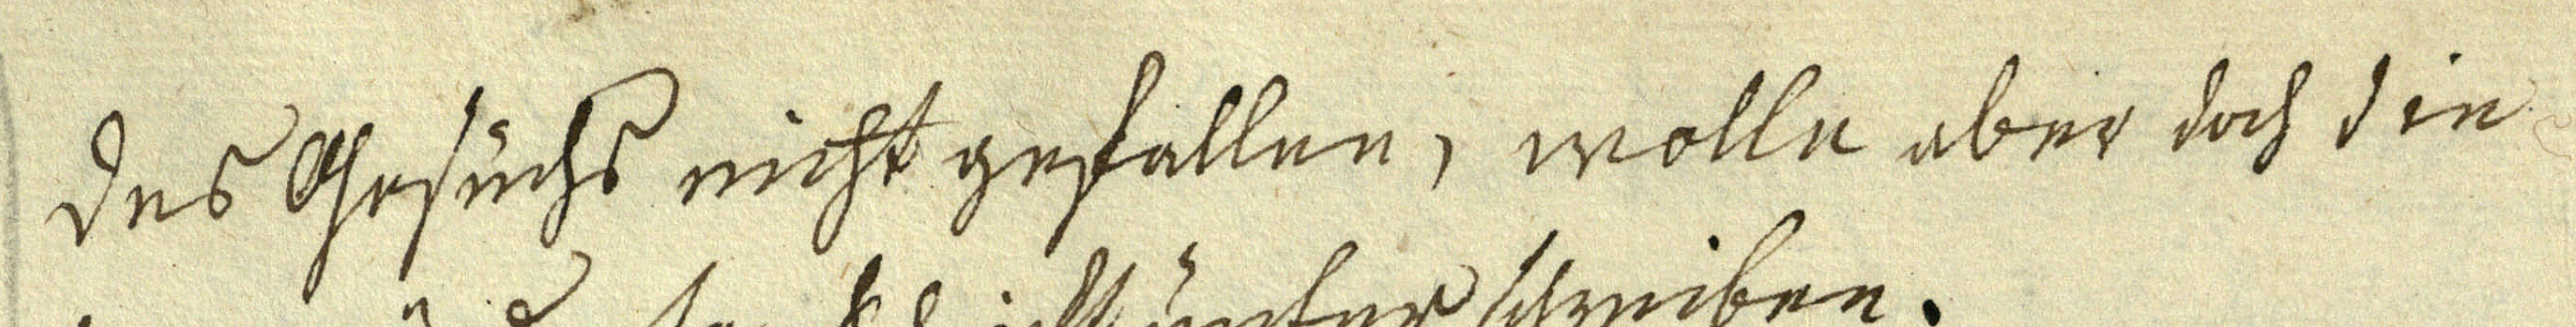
des Gesuchs nicht gefallen, wolle aber doch die
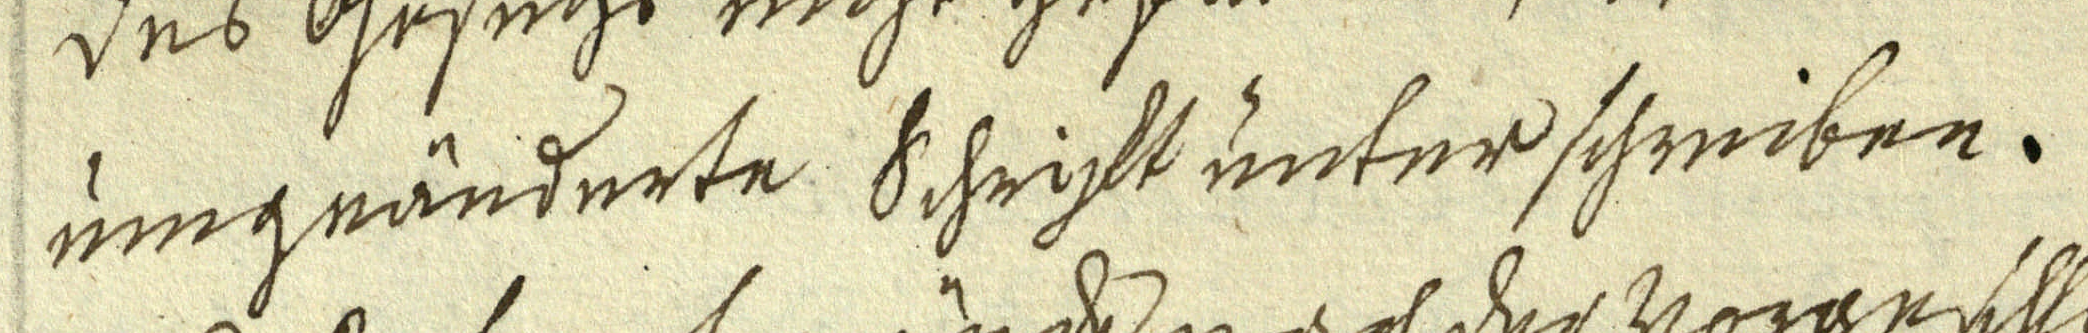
umgeänderte Schrift unterschreiben.
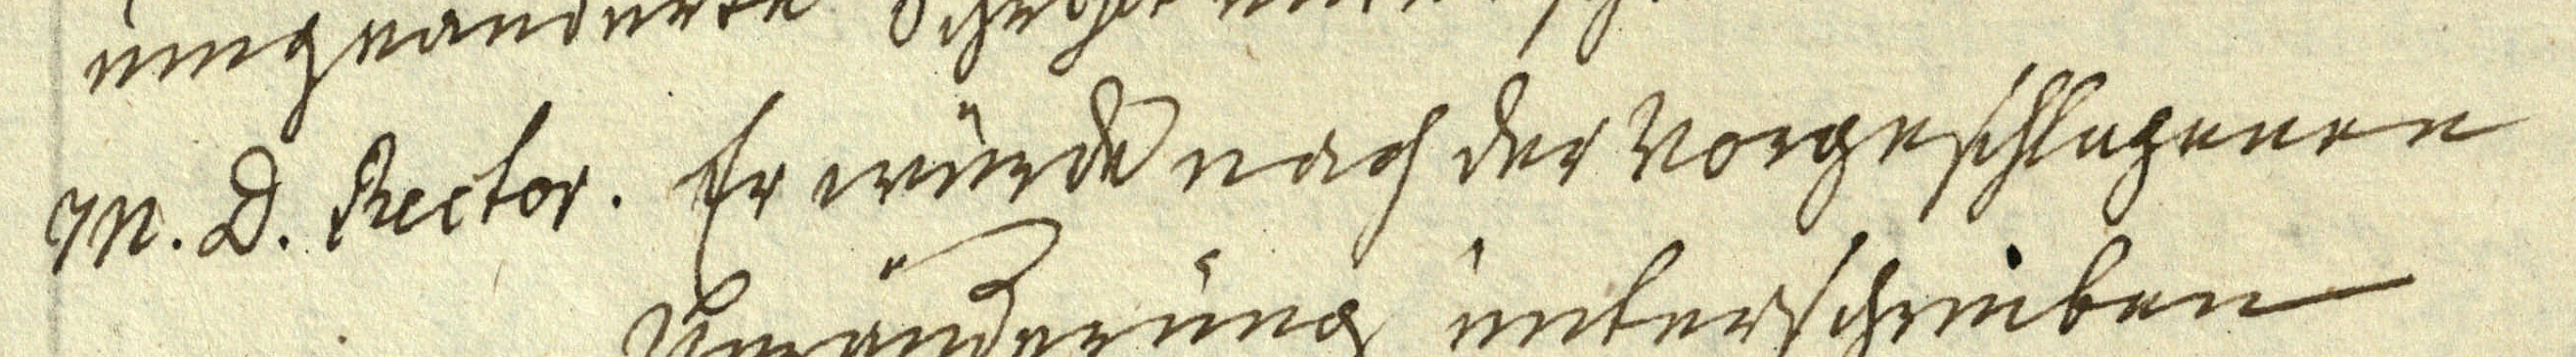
M. D. Rector. Er würde nach der vorgeschlagenen
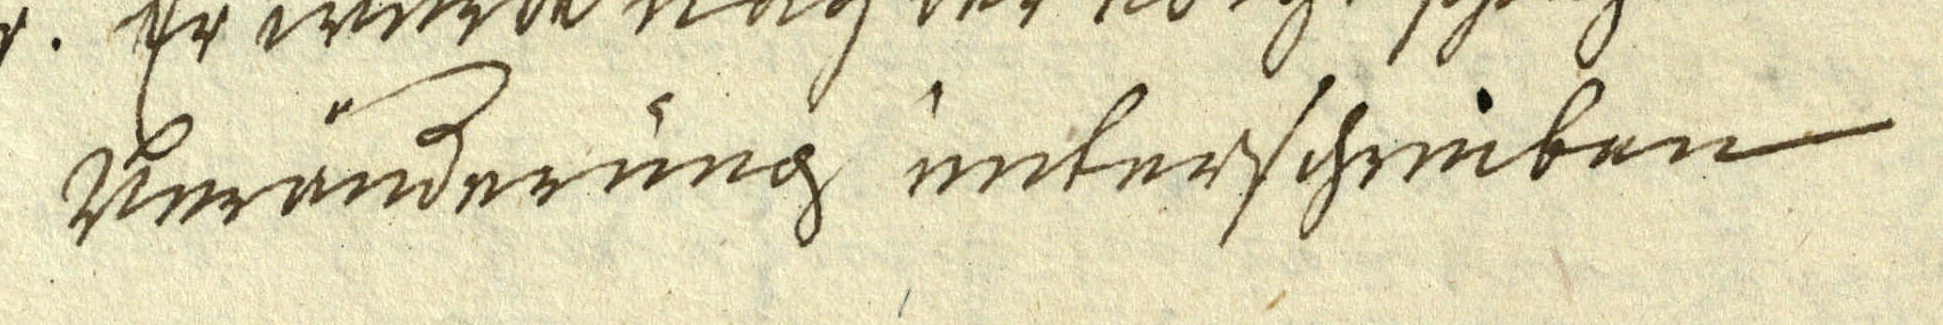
Veränderung unterschreiben.
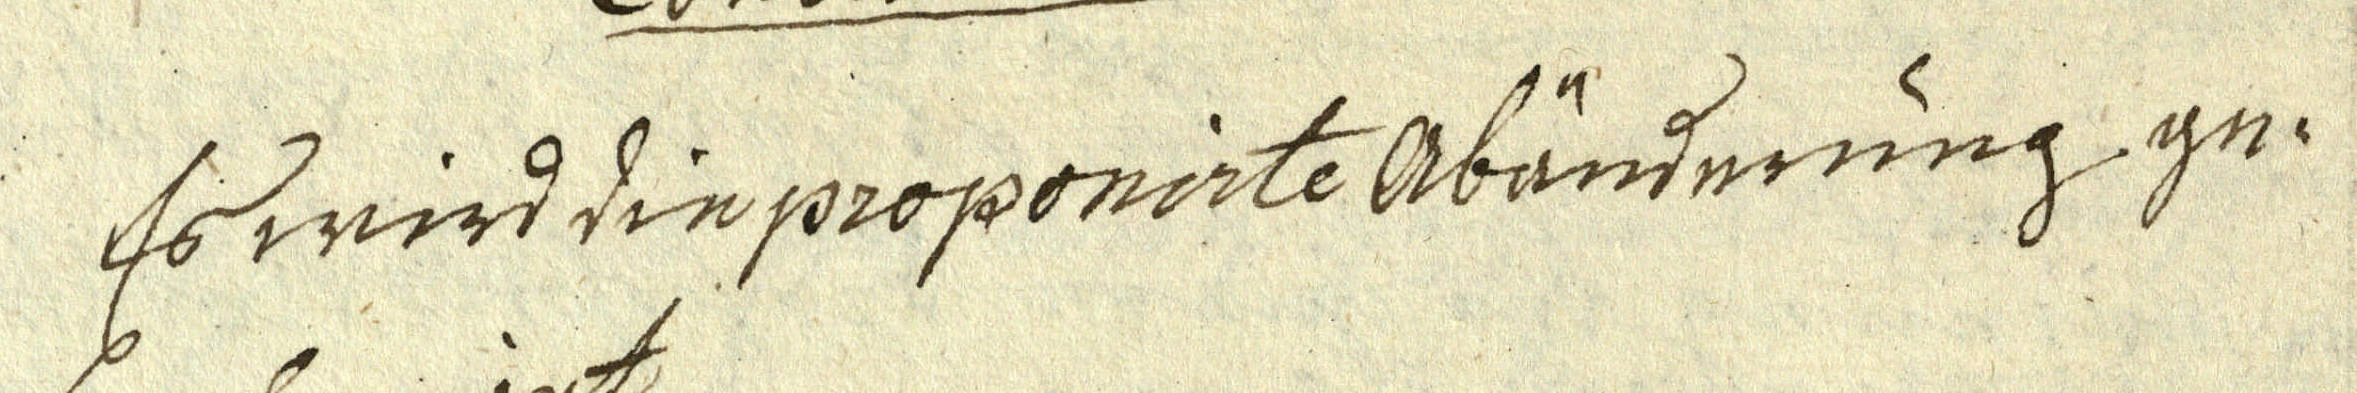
Es wird die proponirte Abänderung ge¬
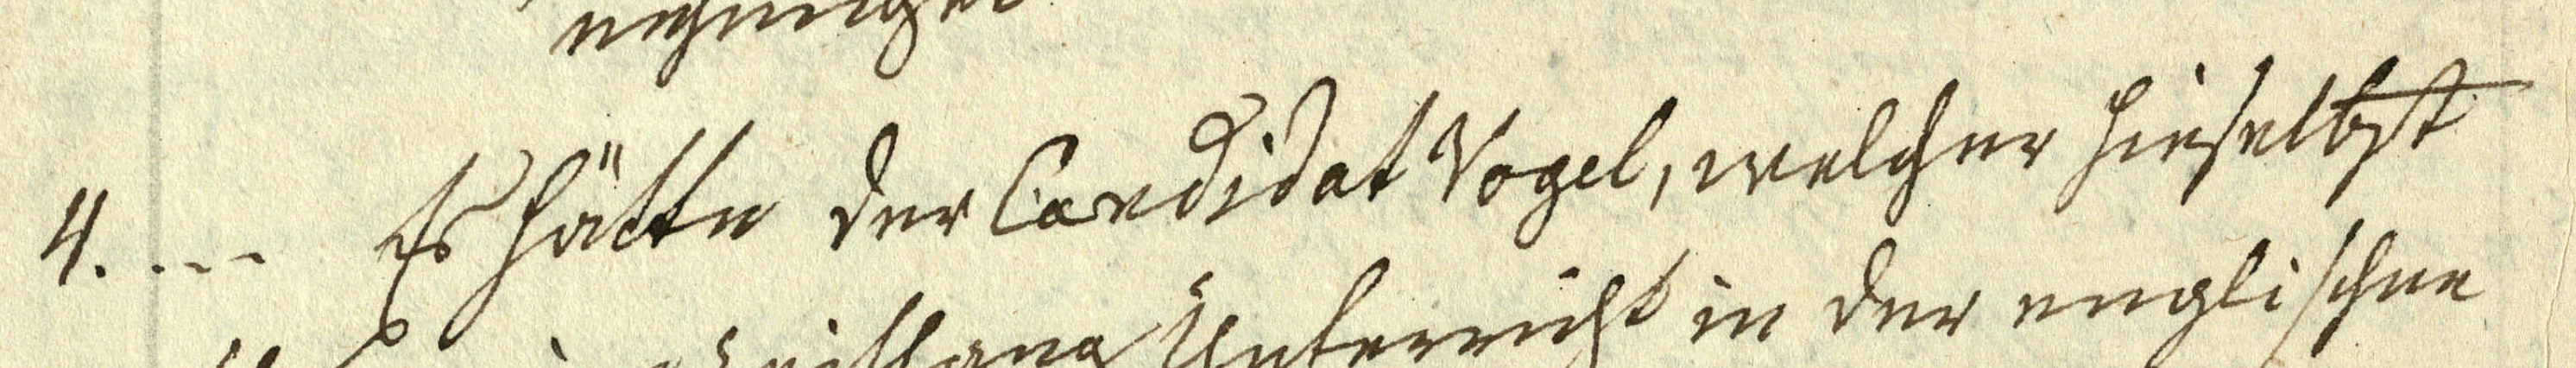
4. Es hätte der Candidat Vogel, welcher hieselbst
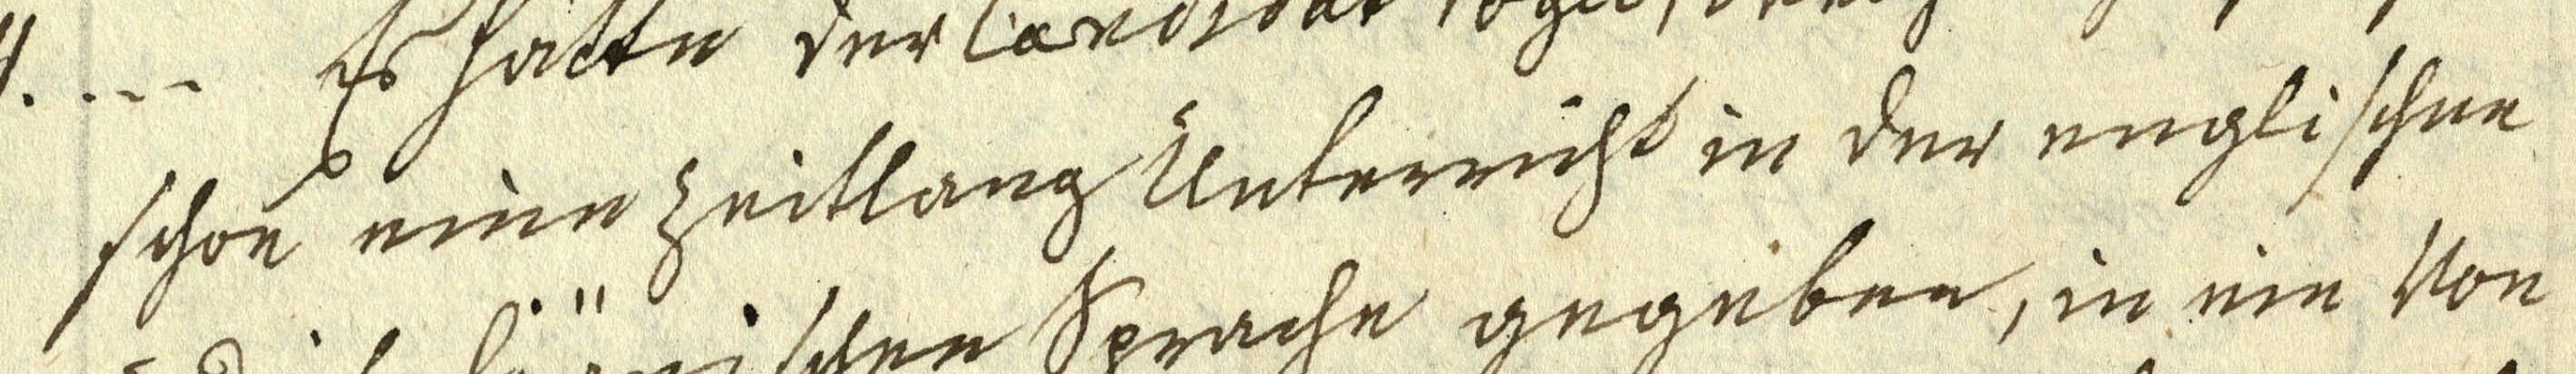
schon eine zeitlang Unterricht in der englischen
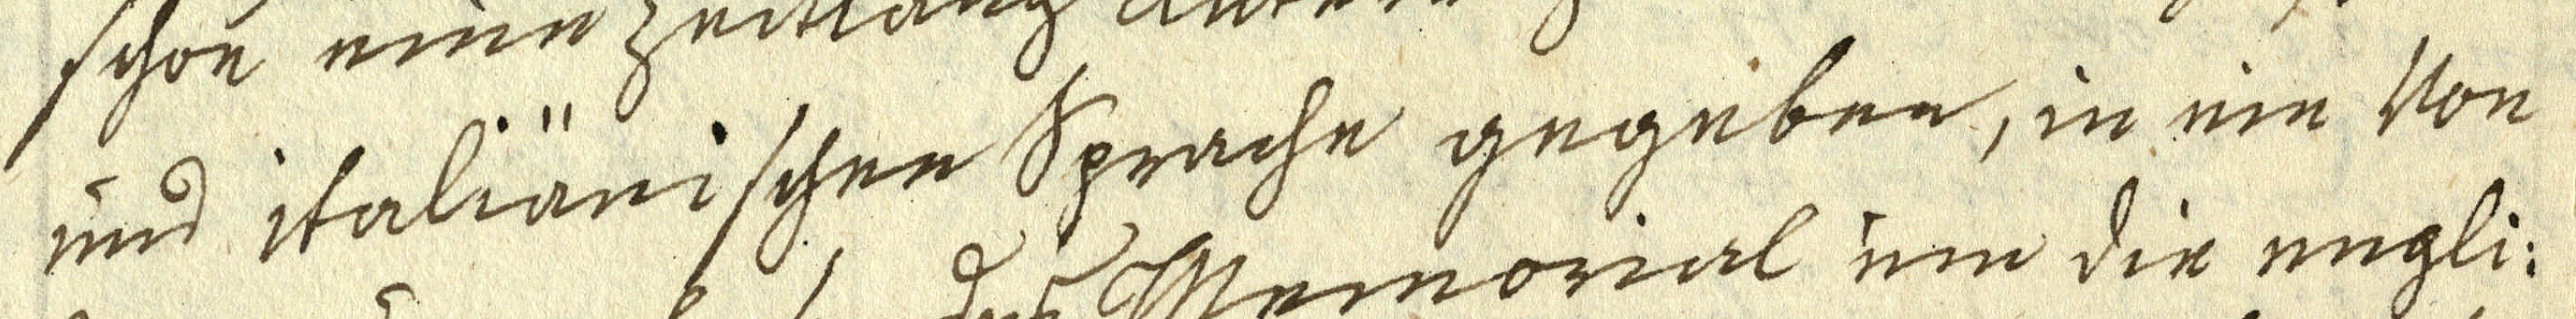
und italiänischen Sprache gegeben, in ein von
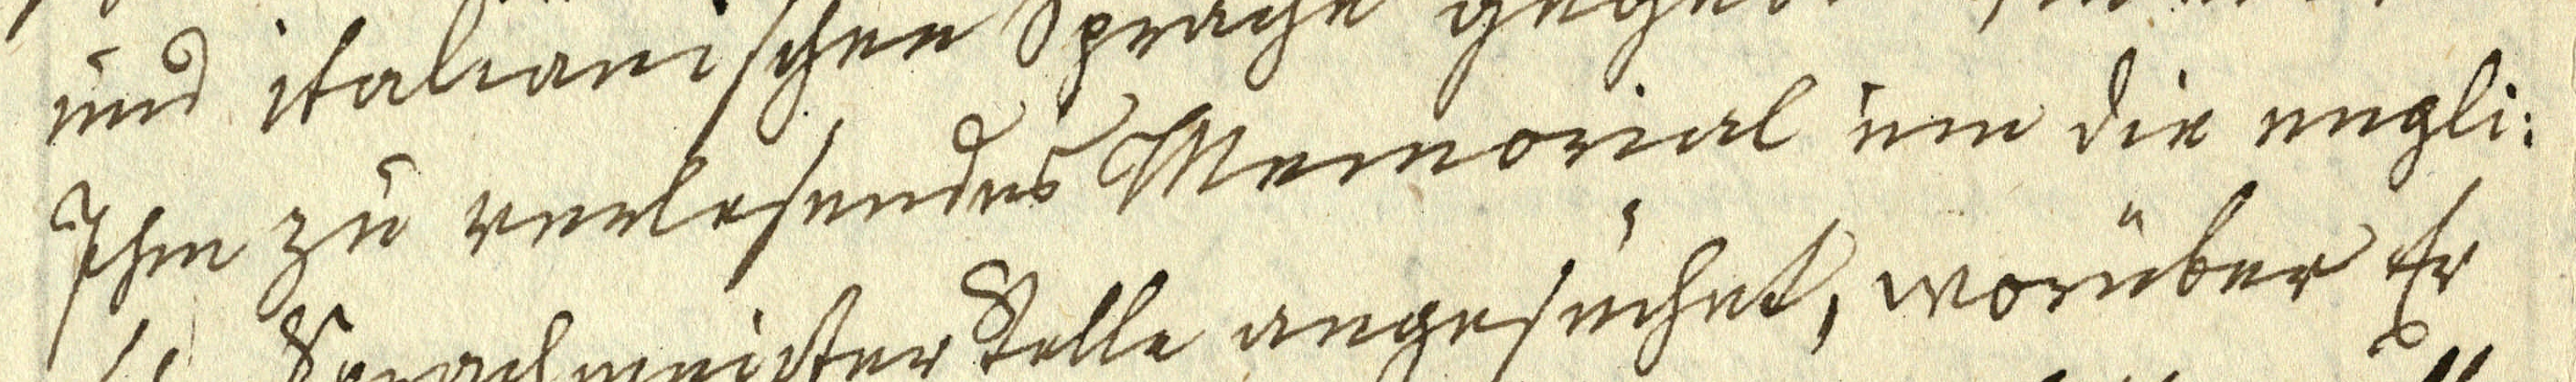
Ihm zu verlesendes Memorial um die engli¬
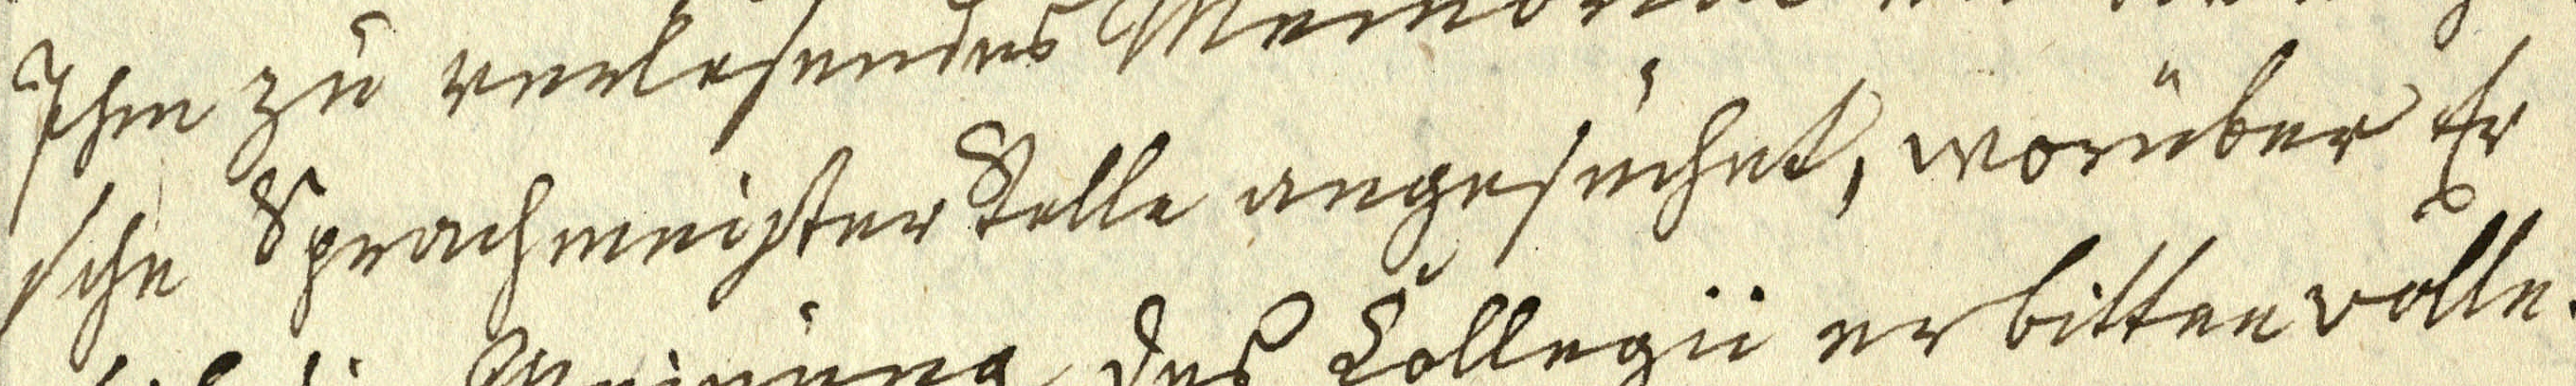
sche Sprachmeister Stelle angesuchet, worüber Er
